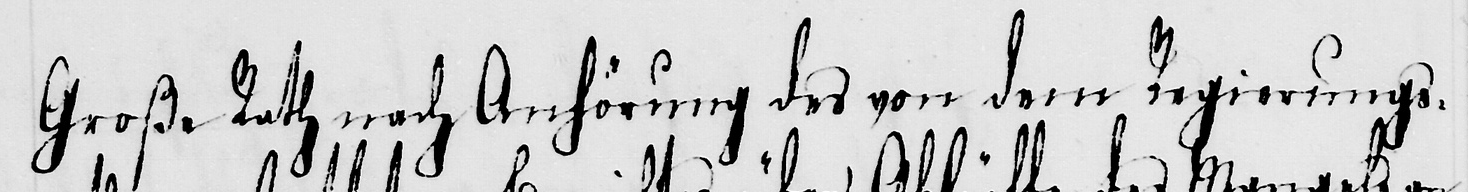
Große Rath nach Anhörung des von dem Regierungs¬
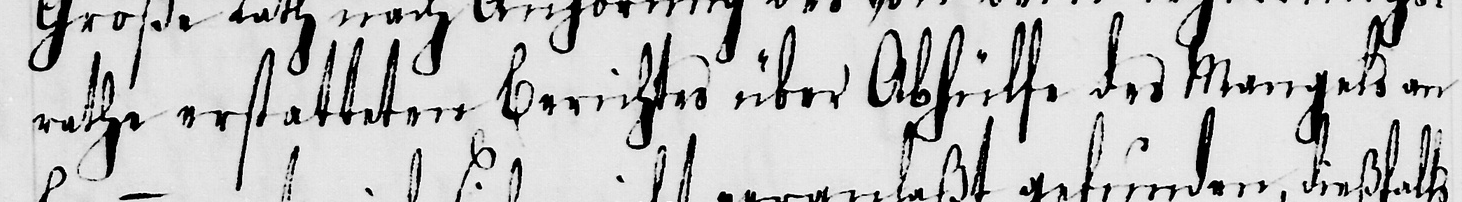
rathe erstatteten Berichtes über Abhülfe des Mangels an
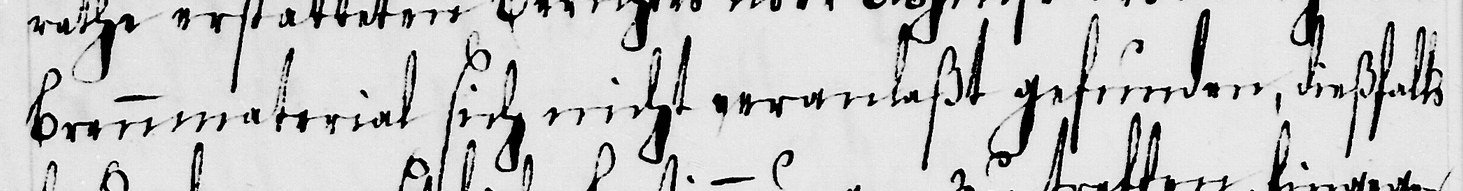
Brennmaterial sich nicht veranlaßt gefunden, dießfalls
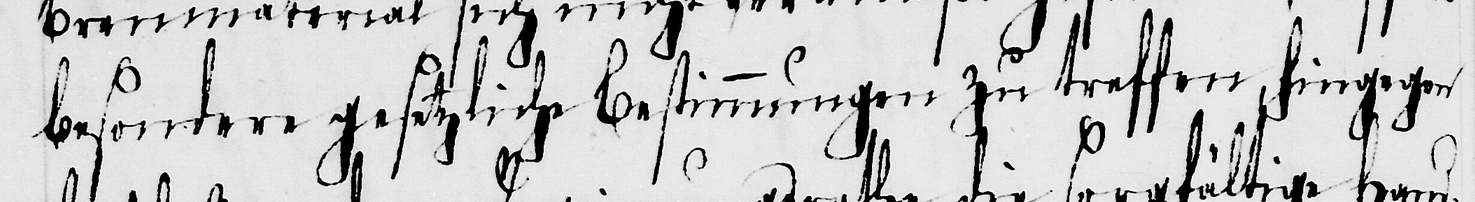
besondere gesetzliche Bestimmungen zu treffen, hingegen
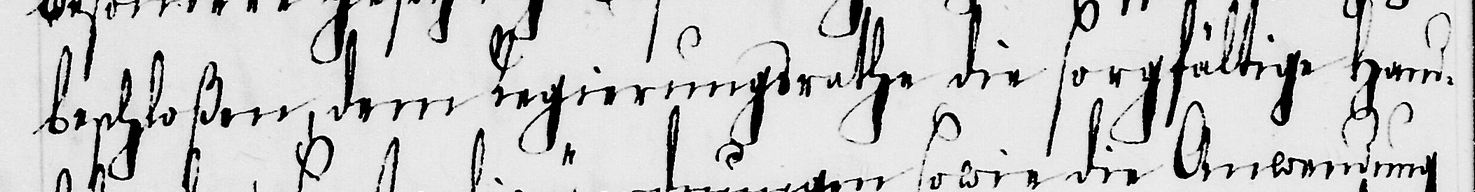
beschloßen, dem Regierungsrathe die sorgfältige Hand¬
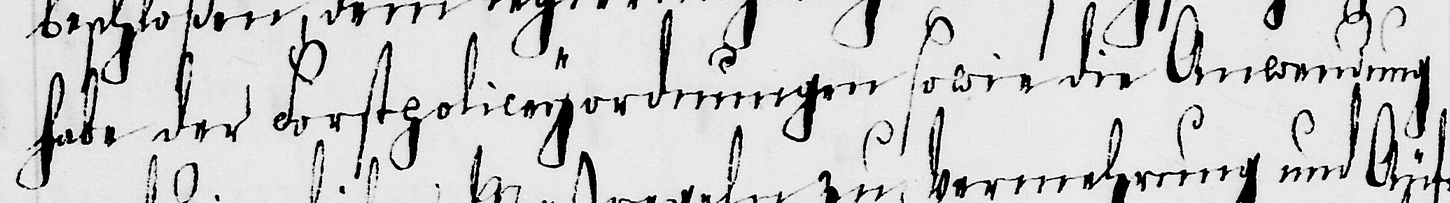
habe der Forstpoliceyordnungen sowie die Anwendung
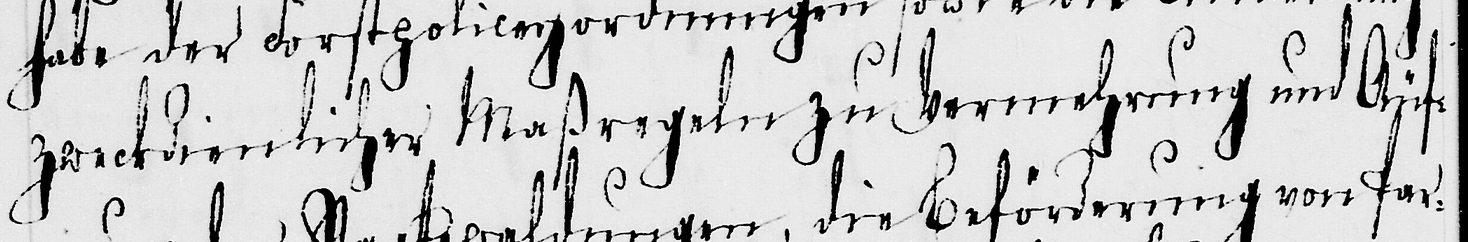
zweckdienlicher Maßregeln zu Vermehrung und Äuf¬
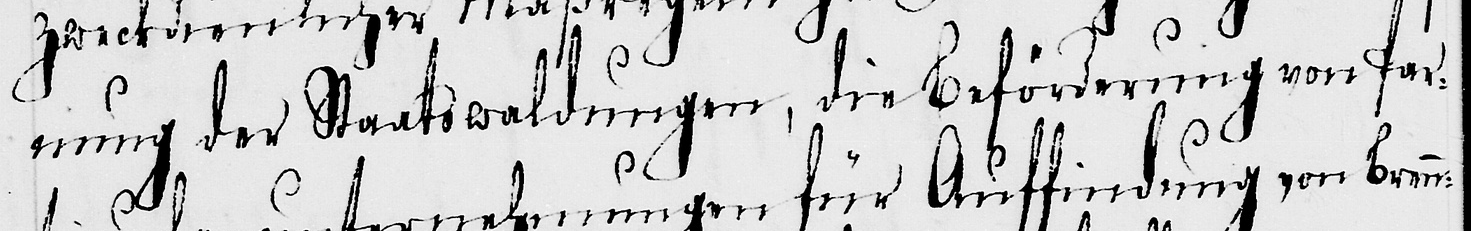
nung der Staatswaldungen, die Beförderung von Par¬
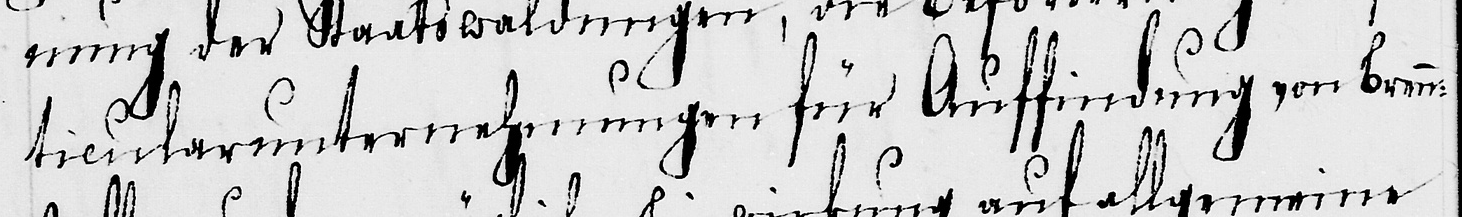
ticularunternehmungen für Auffindung von Bren¬
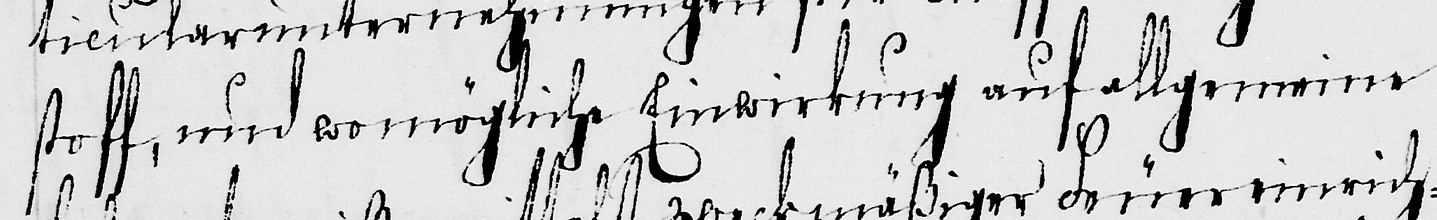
stoff, und womögliche Einwirkung auf allgemeine
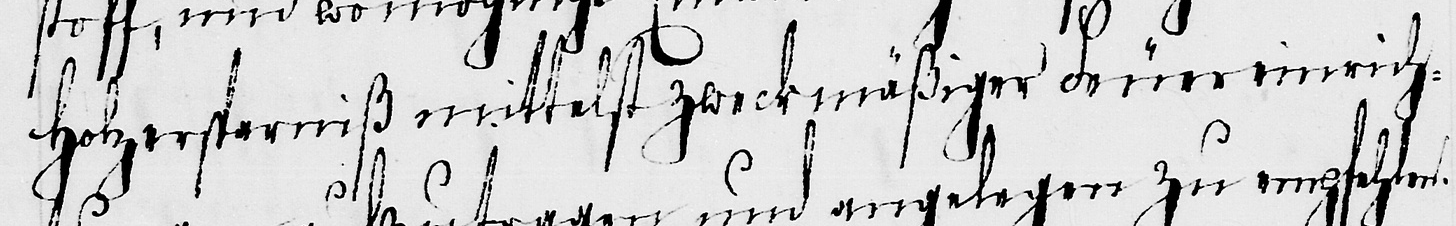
Holzersparniß mittelst zweckmäßiger Feuereinrich¬
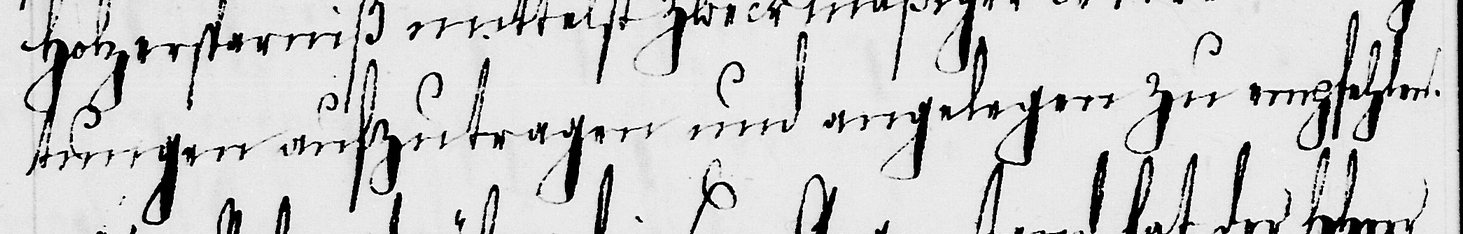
tungen aufzutragen und angelegen zu empfehlen.
